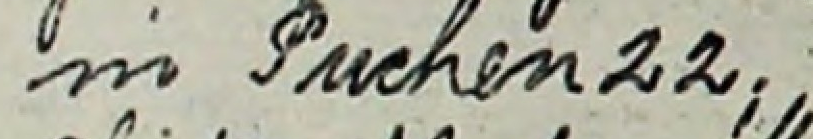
110.) 111.) Herr Franz und Frau Maria Frosch, Grundbesitzer
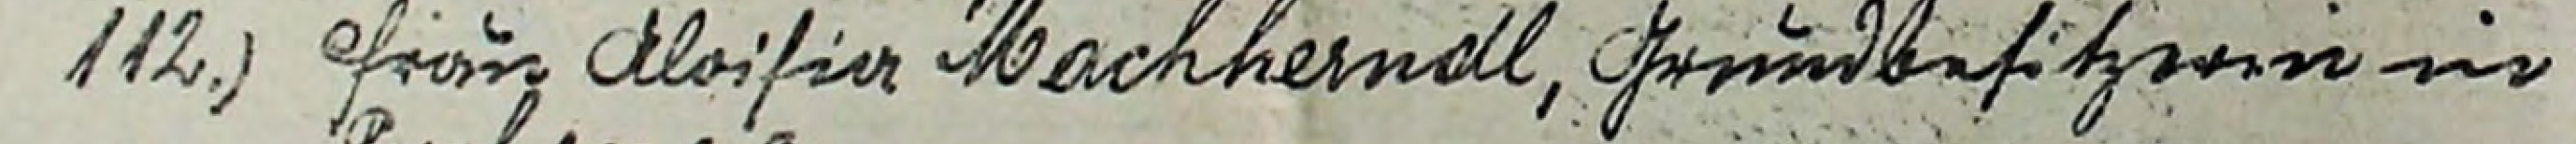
in Puchen 22;
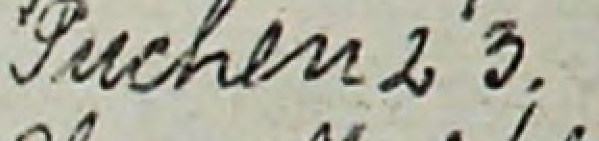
112.) Frau Aloisia Machherndl, Grundbesitzerin in
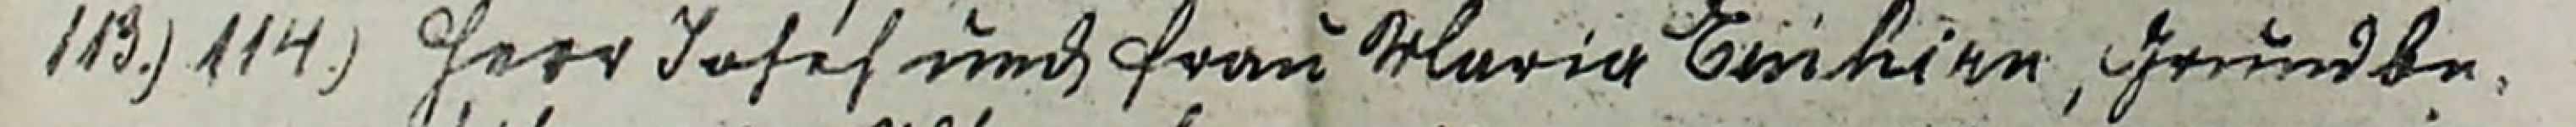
Puchen 23;
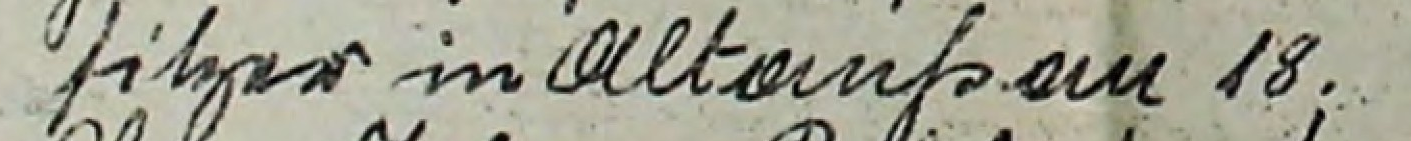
113.) 114.) Herr Josef und Frau Maria Einhirn, Grundbe„
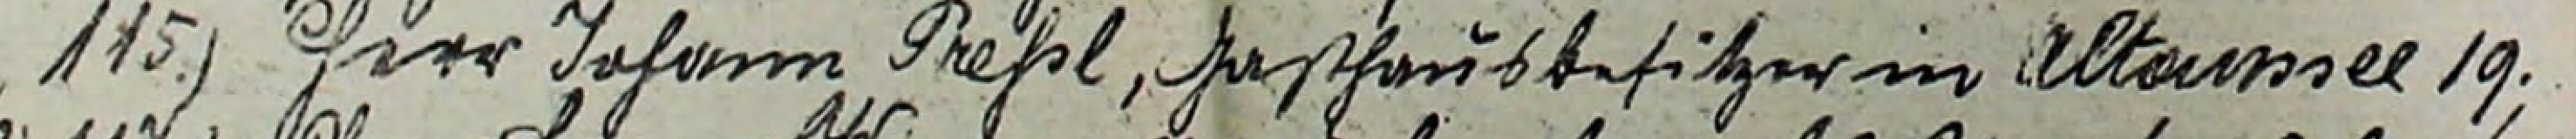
sitzer in Altaussem 18;
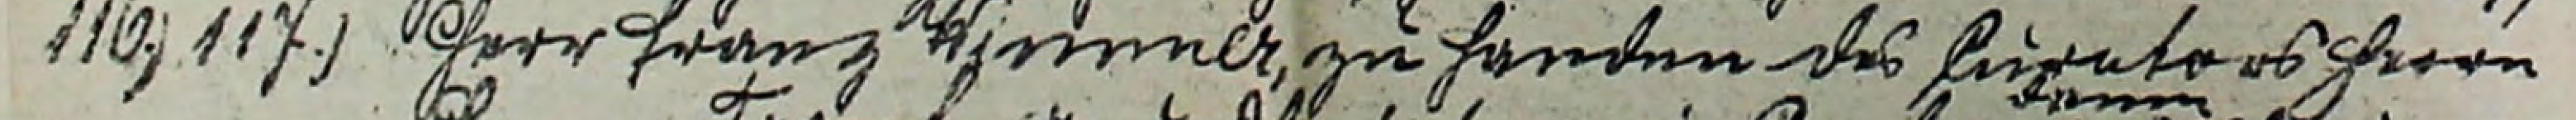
115.) Herr Johann Pressl, Gasthausbesitzer in Altaussee 19;
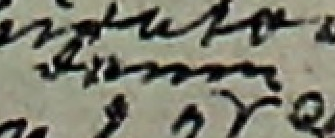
116.) 117.) Herr Franz Wimmer, zu Handen des Curotors Herrn
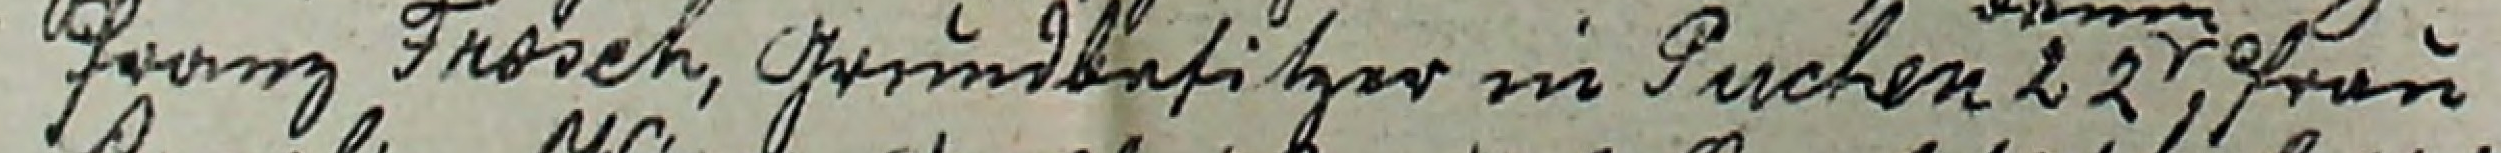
d???
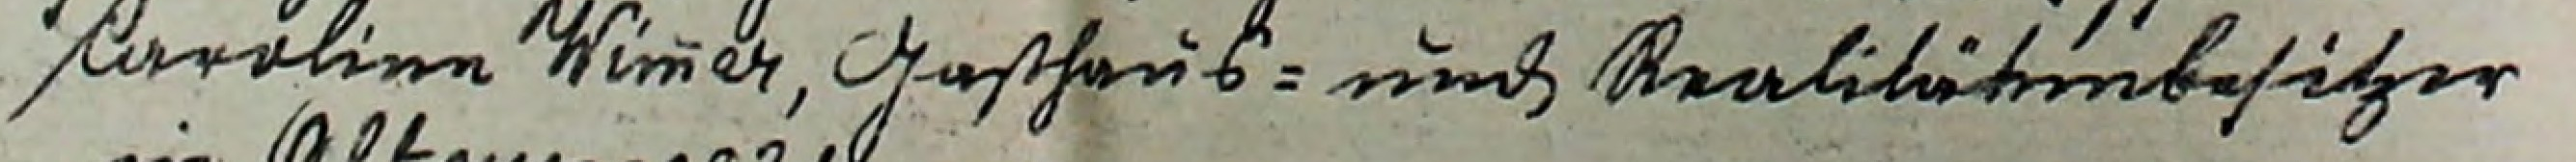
Franz Frosch, Grundbesitzer in Puchen 22, Frau
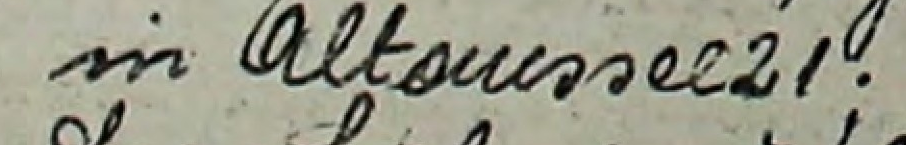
Caroline Wimmer, Gasthaus- und Realitätenbesitzer
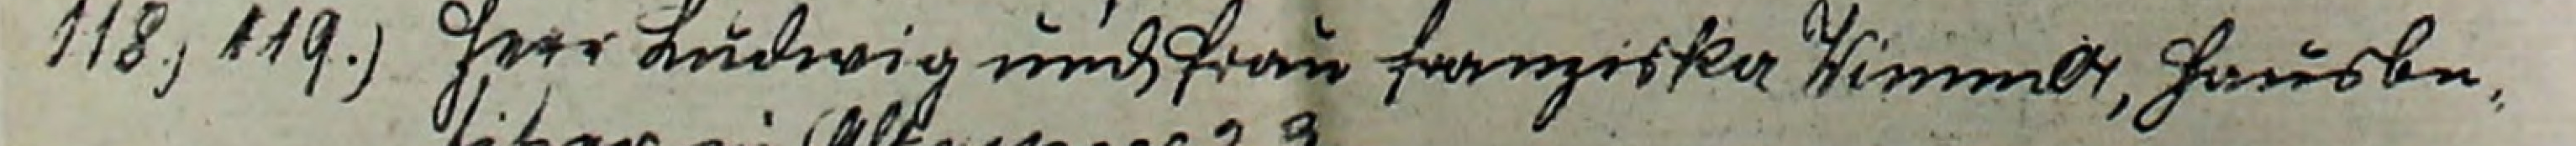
in Altaussee 21;
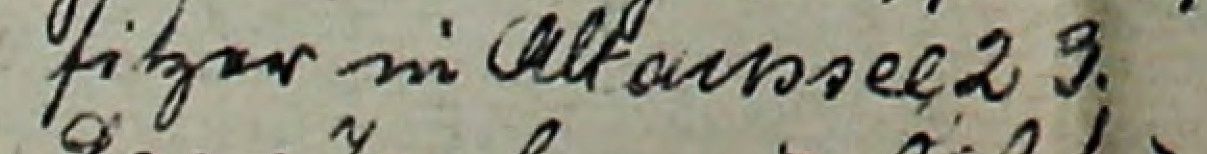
118.) 119.) Herr Ludwig und Frau Franziska Wimmer, Hausbe„
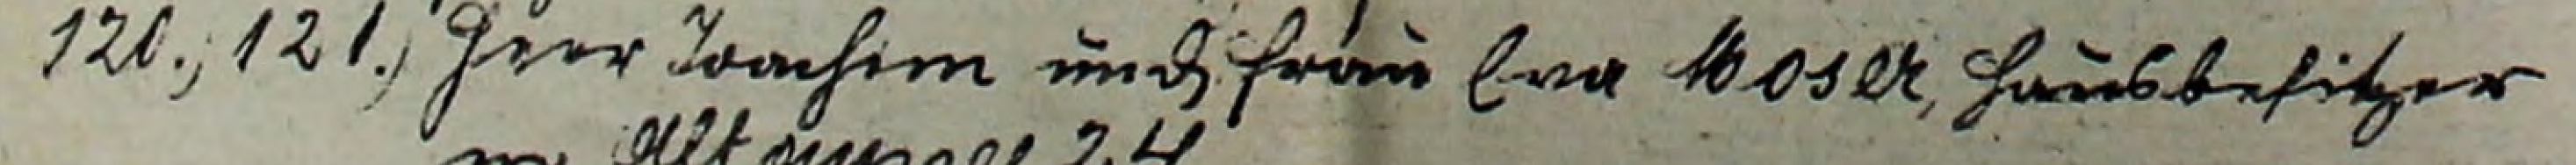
sitzer in Altaussee 23;
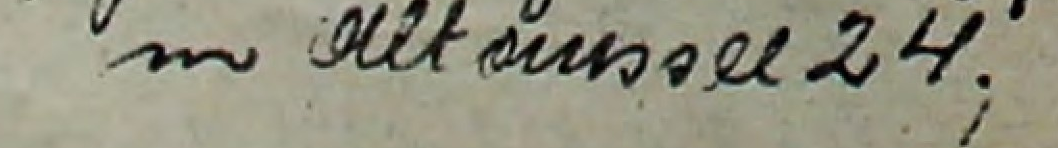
120.) 121.) Herr Joachim und Frau Eva Moser, Hausbesitzer in Altaussee 24;
